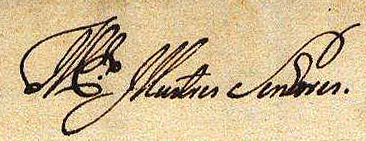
M.to Illustres Senhores.
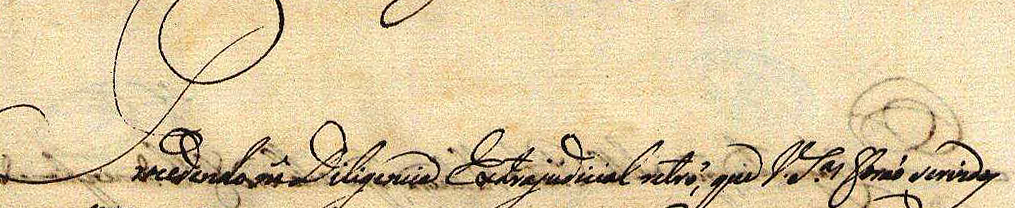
Precedendo na Diligencia Extrajudical retró, que V. S.as foraõ servidos
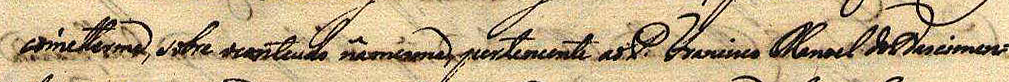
com̄etterme, sobre o conteudo na mesma, pertencente ao P.e Francisco Manoel do Nascimen
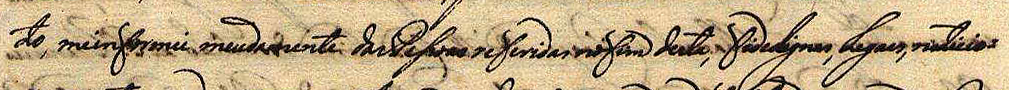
to, me informei meudamente das Pessoas referidas no fim desta, fidedignas, legaes, noticio
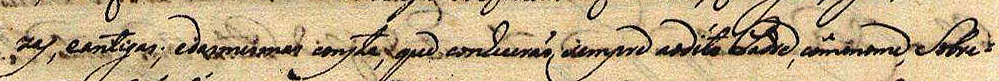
zas, e antigas; e das mesmas consta, que conheceraõ, sempre ao dito Padre, com o nome, Sobre
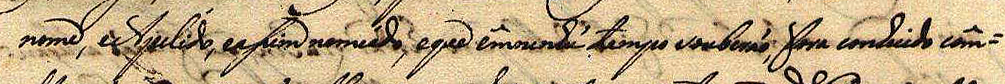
nome, e Apelido, e assim nomeádo, e que em nenhū tempo souberaõ, fora conhecido com
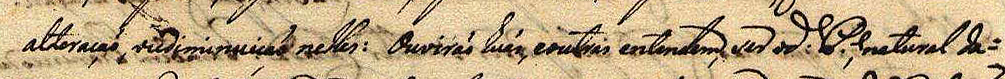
alteraçaõ, ou diminuiçaõ nelles: Ouviraõ huās, e outras entendem, ser o d.o P.e, natural da
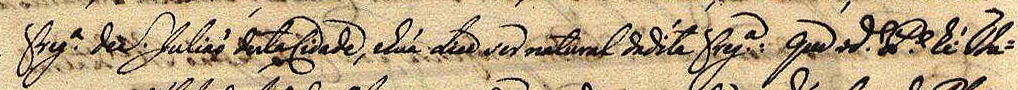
freg.a de S. Juliaõ desta Cidade, e huā dice ser natural da dita freg.a: que o d.o P.e hé The
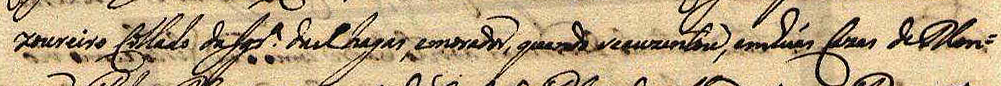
zoureiro Collado da Jgr.a das Chagas, e morador, quando se auizinhou, em huās Cazas de Mon
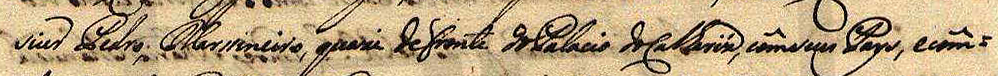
siur Pedro, Marssineiro, quazi defronte do Palacio do Calhariz̄, com seus Pays, e com
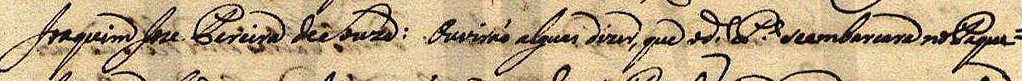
Joaquim Joze Pereira de Souza: Ouviraõ alguas dizer, que o d.o P.e se embarcara no Paque
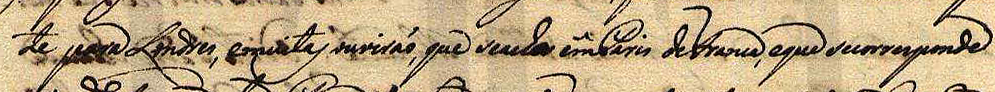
te para Londres, e muitas ouviraõ, que se acha em Paris de França, e que se corresponde
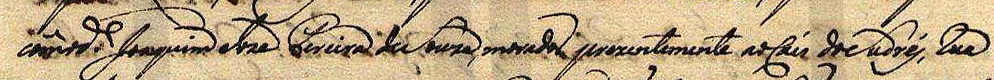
com o d.o Joaquim Ioze Pereira de Souza, morador prezentemente ao Caés do Sudrés, Rua
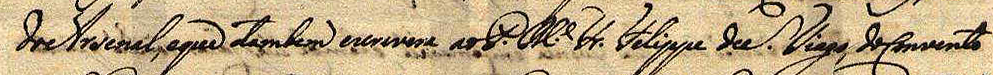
do Arsenal, e que tambem escrevera ao P. M.e Fr. Felippe de S. Tiago, do Convento
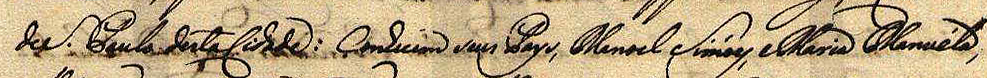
de S. Paulo desta Cidade: Conhecem seus Pays, Manoel Simões, e Maria Manuéla,
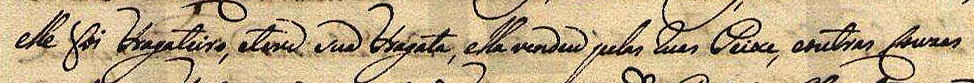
elle foi Fragateiro, e teve sua Fragata, ella vendeu pelas Ruas Peixe, e outras Couzas
